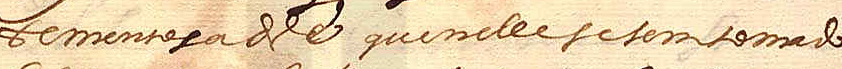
tementes a ds E que nelle se tem tomado
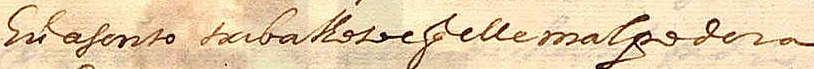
hū asento trabalhoso e q̄ elle mal podera
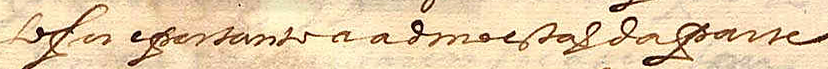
sofar e portanto a admoestaõ da parte
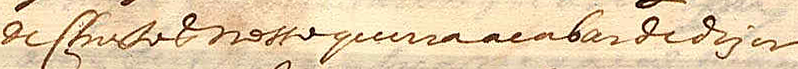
de Christo s̄ nosso queira acabar de dizer
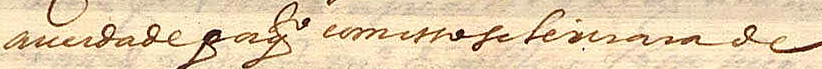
a uerdade porqto com isso se liurara de
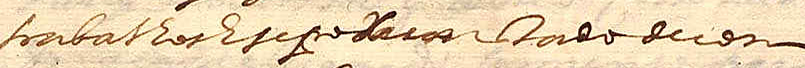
trabalhos E se podaem estado de com
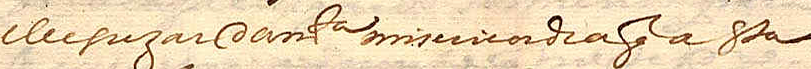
elle se uzar da mta misericordia q̄ a sta
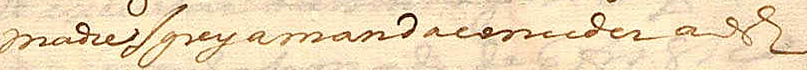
madre Jgreija manda conceder aos
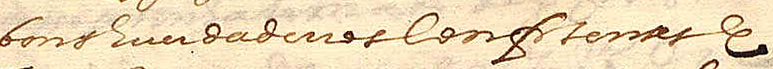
bons E uerdadeiros confitentes E
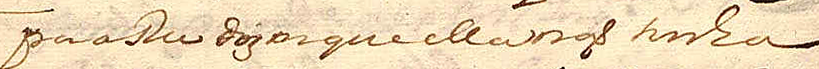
por o Reo dizer que ella naõ tinha
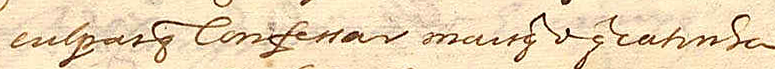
culpas q̄ confessar mais q̄ o q̄ ia tinha
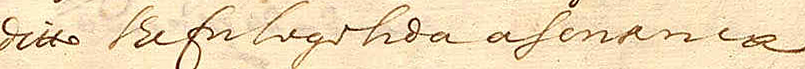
ditto lhe foi logo lida a sentenca
